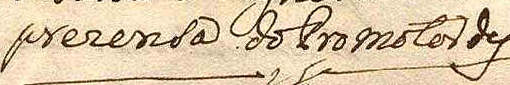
prezensa do Promotor des
